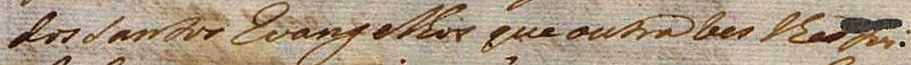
dos santos Evangelhos que outra ves lhes foi
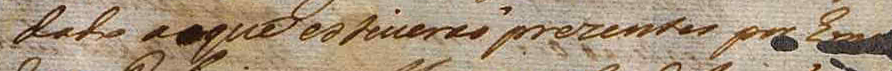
dado ao que estiueraõ prezentes por hon
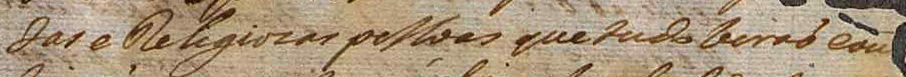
tas e Religiozas pessoas que tudo viraõ e ou
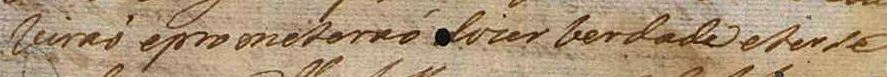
Viraõ e prometeraõ dizer verdade e ter se
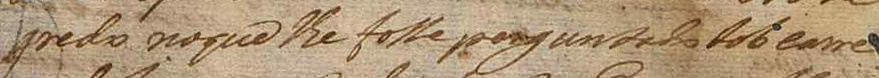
gredo no que lhe fosse perguntado sob carre
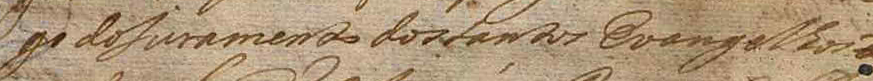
go do Juramento dos santos Evangelhos
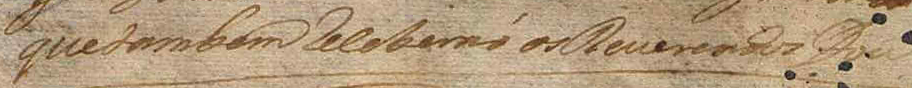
que tambem Receberaõ os Reuerendos Dou
